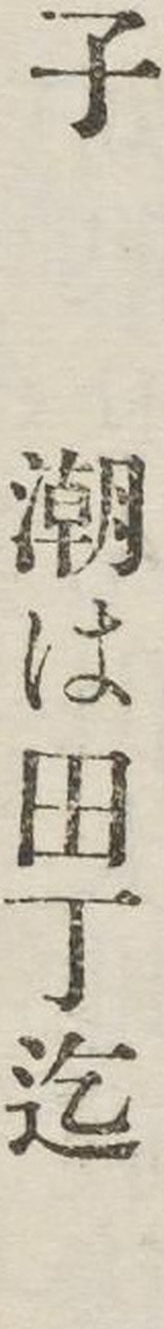唐濱潮は田丁迄
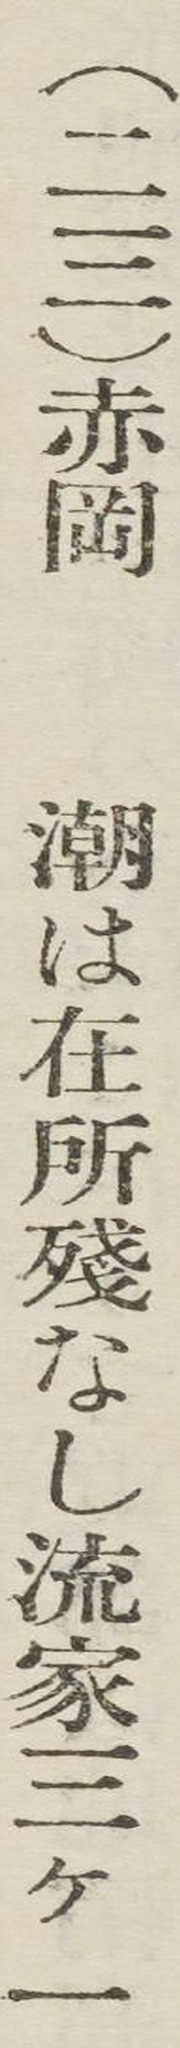赤岡潮は在所残なし流家三ヶ一
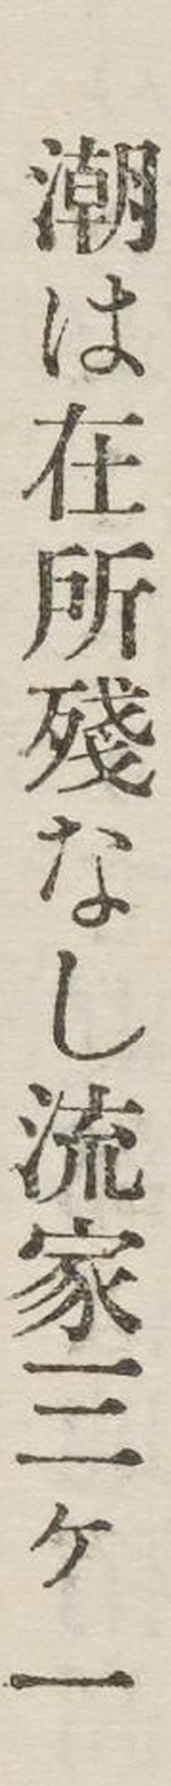赤岡潮は在所残なし流家三ヶ一
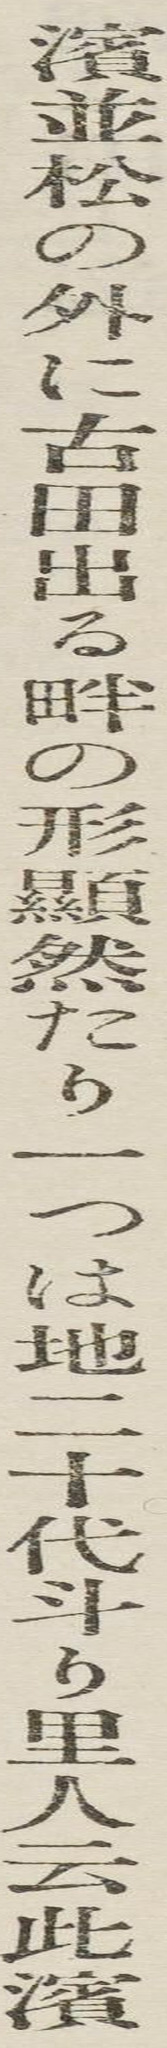濱並松の外に古田出る畔の形顕然たり一つは地二十代斗り里人云此濱
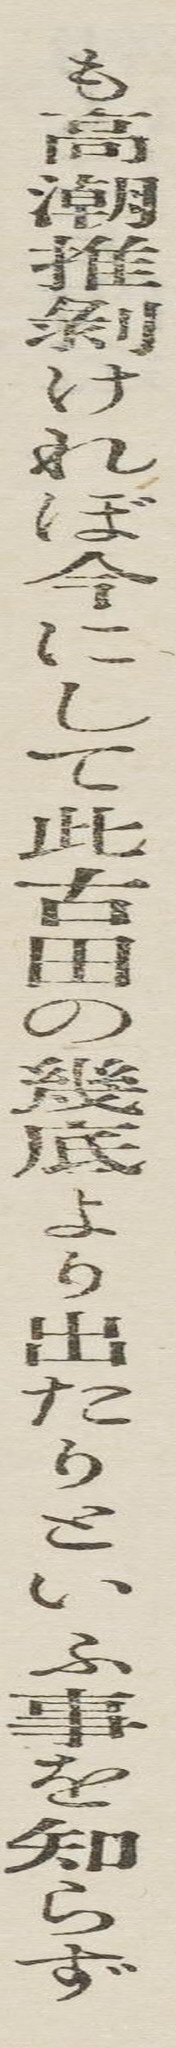も高潮推剥けれぼ今にして此古田の幾底より出たりといふ事を知らず
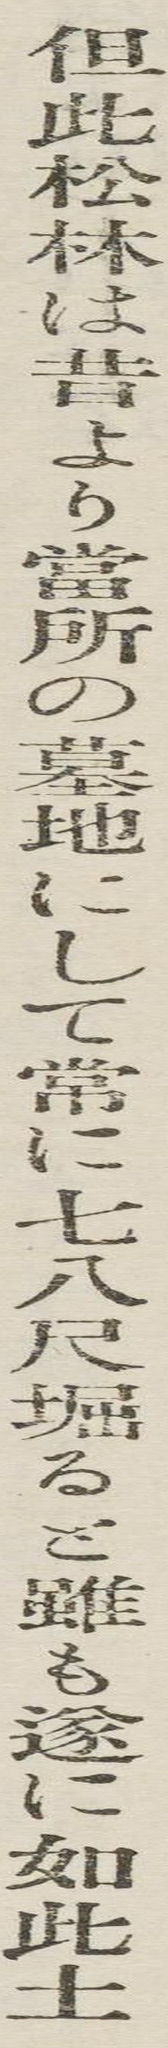但此松林は昔より当所の墓地にして常に七八尺堀ると雖も遂に如此土
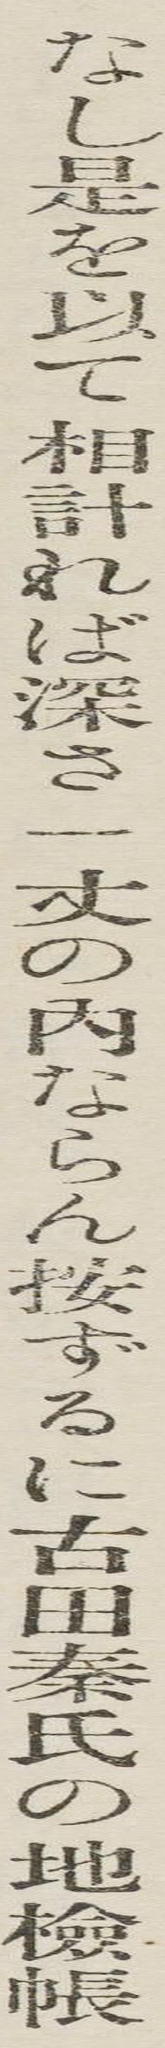なし是を以て相計れば深さ一丈の内なら按ずるに古田秦氏の地検帳
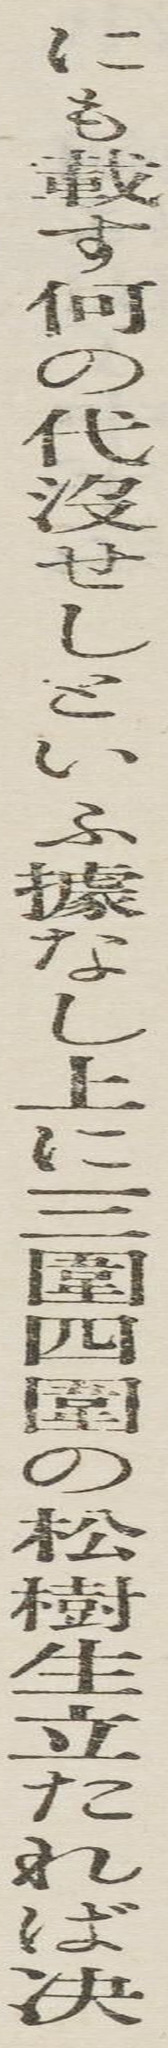にも載す何の代没せしといふ拠なし上に三囲四囲の松樹生立たれば決
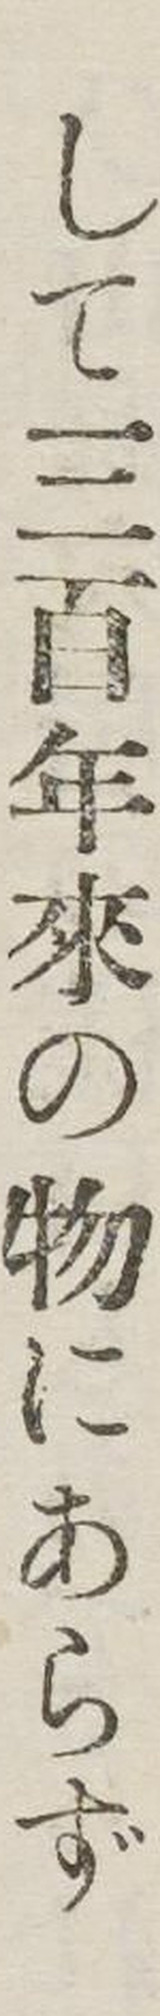して三百年来の物にあらず
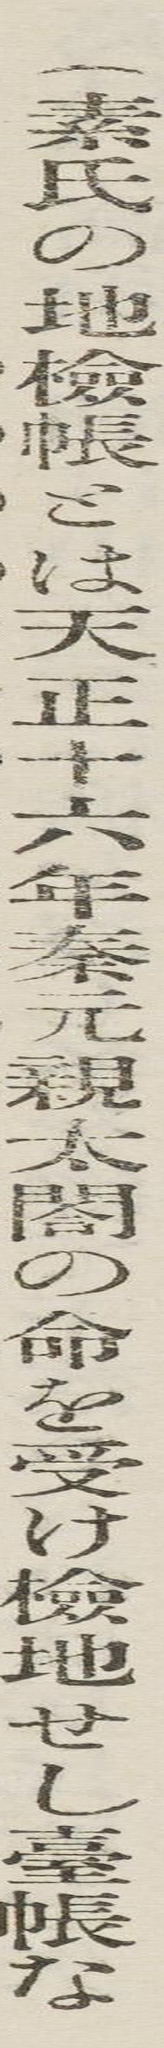（素氏の地検帳とは天正十六年秦元親太閣の命を受け検地せし臺帳な
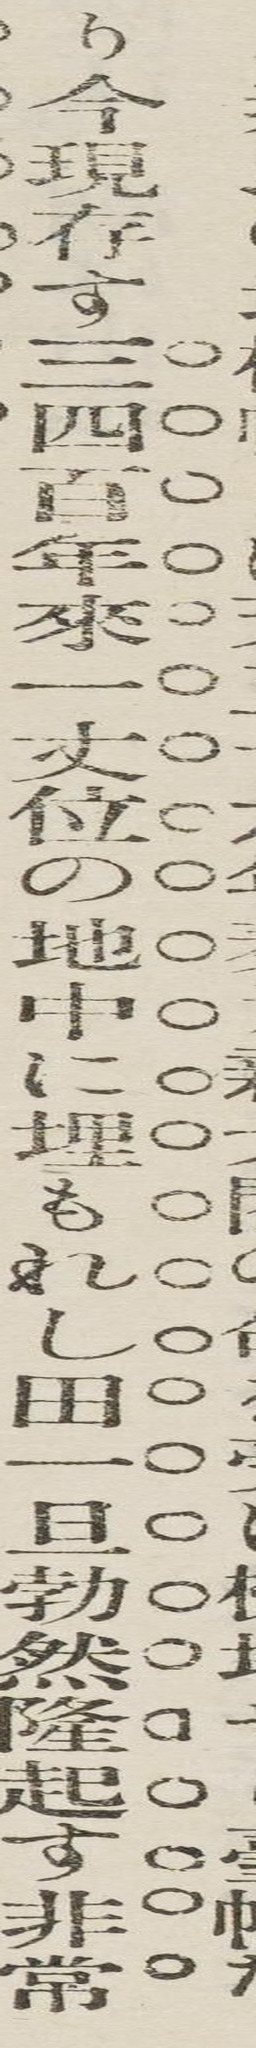り今現存す三四百年來一丈位の地中に埋もれし田一旦勃然隆起す非常
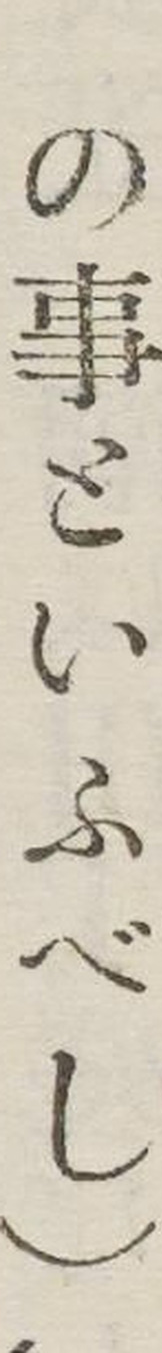の事といふべし）
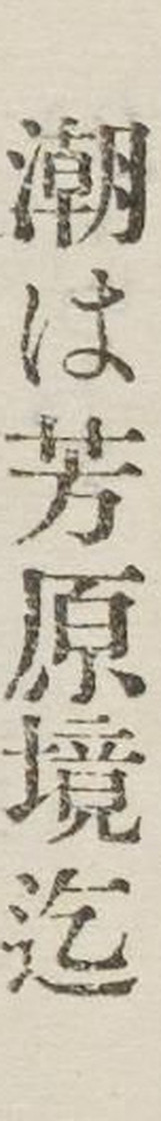野市潮は芳原境迄
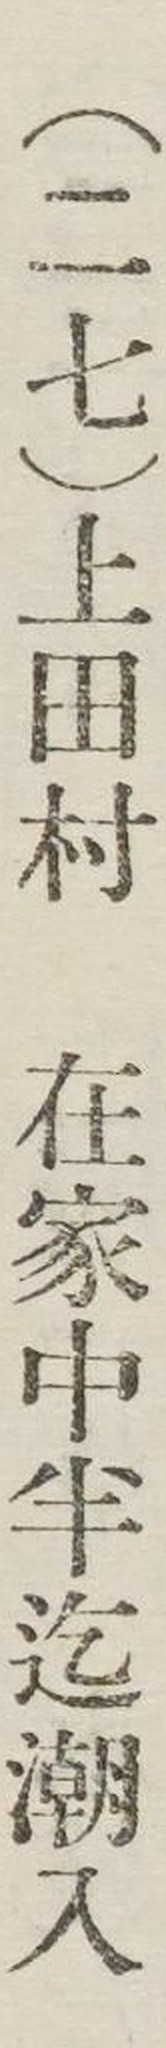上田村在家中半迄潮入
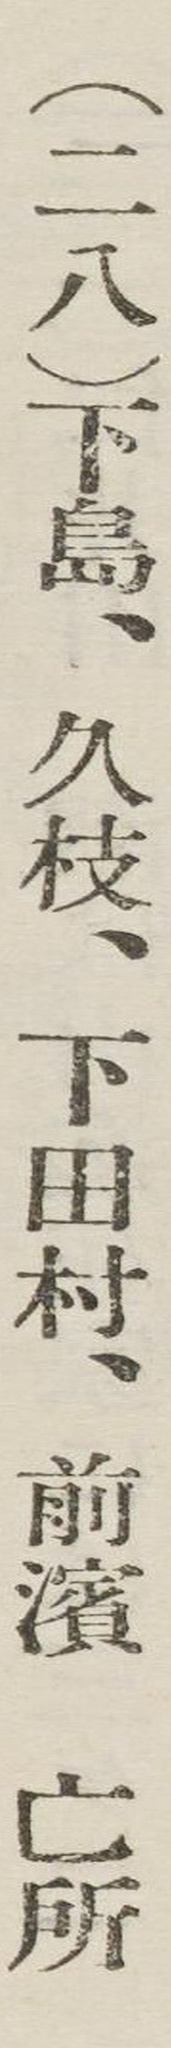下島、久枝、下田村、前濱亡所
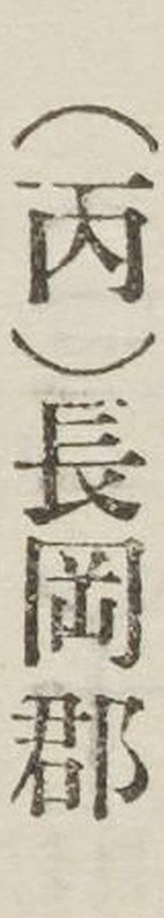長岡郡
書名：土佐古今ノ地震
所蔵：東京大学地震研究所図書室 Earthquake Research Institute Library, The University of Tokyo, JAPAN
